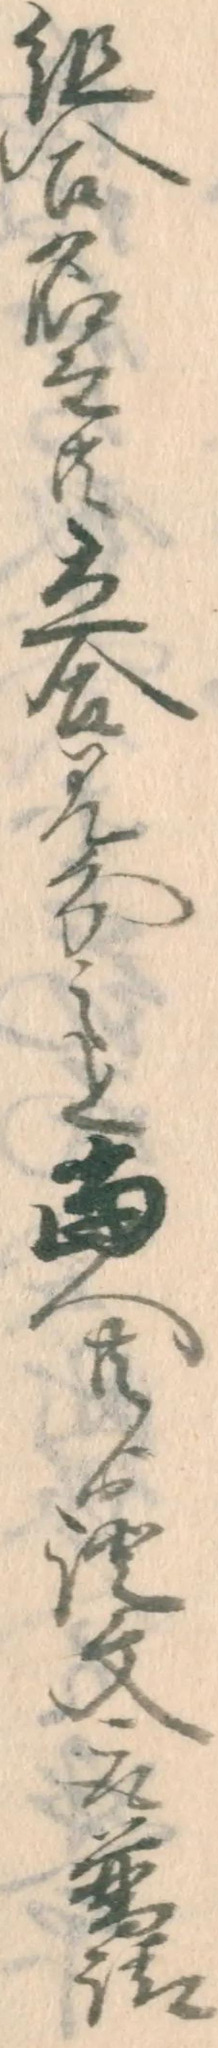組合名主共立合見分之上当人共ゟ証文取普請

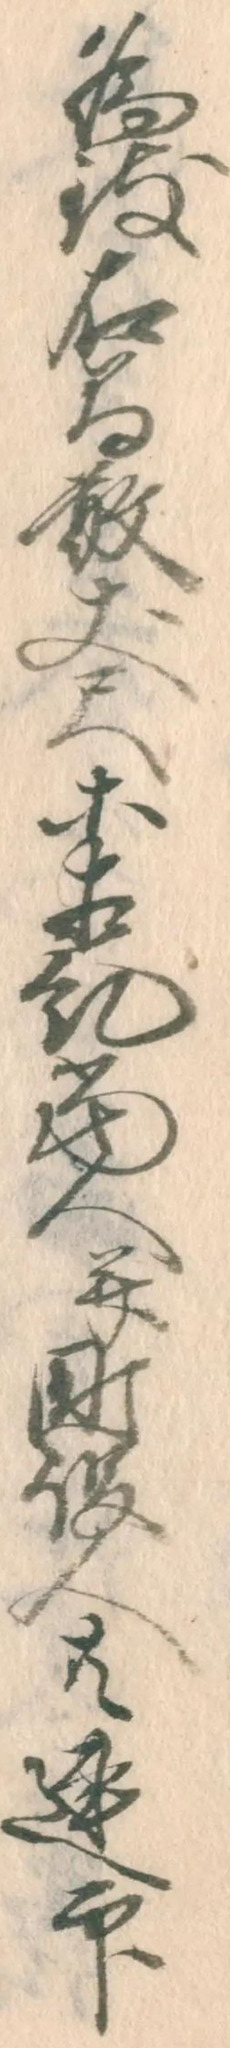為致右間数丈尺等相糺当人幷町役人共連印
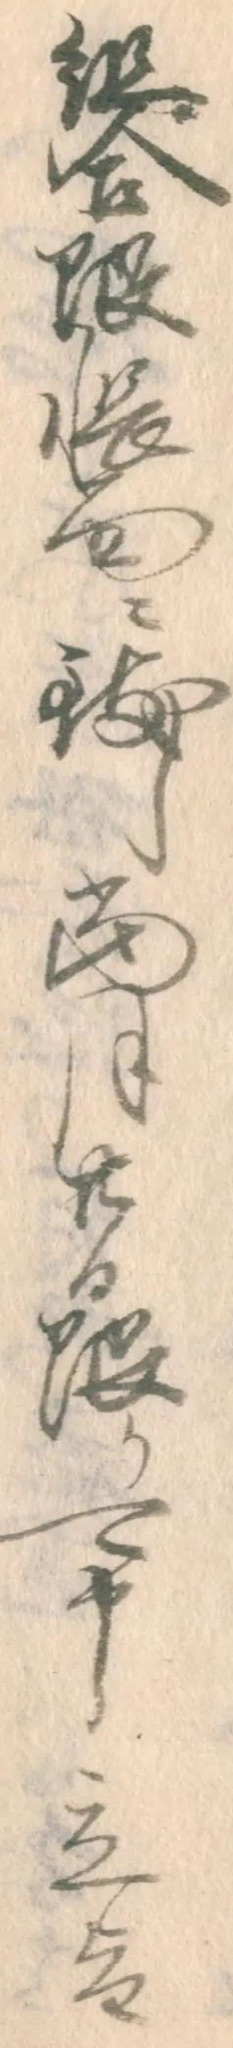組合限帳面ニ致し当月廿日限リ可申立旨
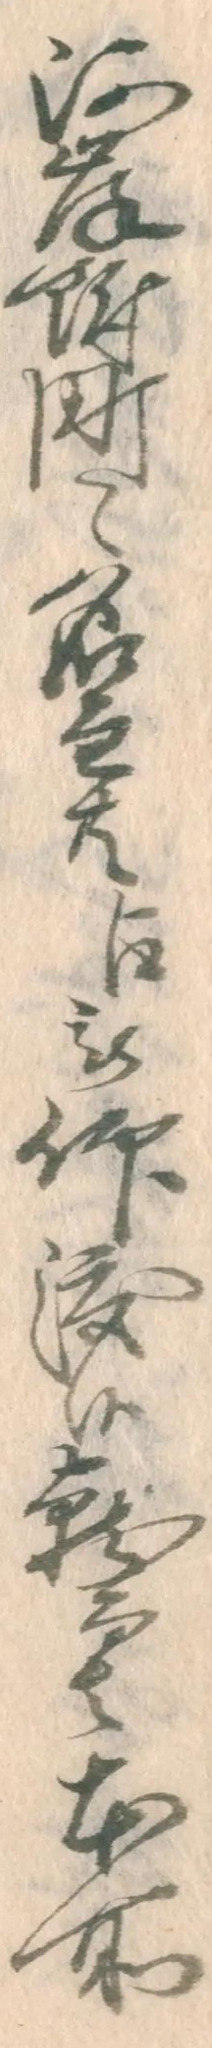河岸附町々名主共え被仰渡候就而は本所
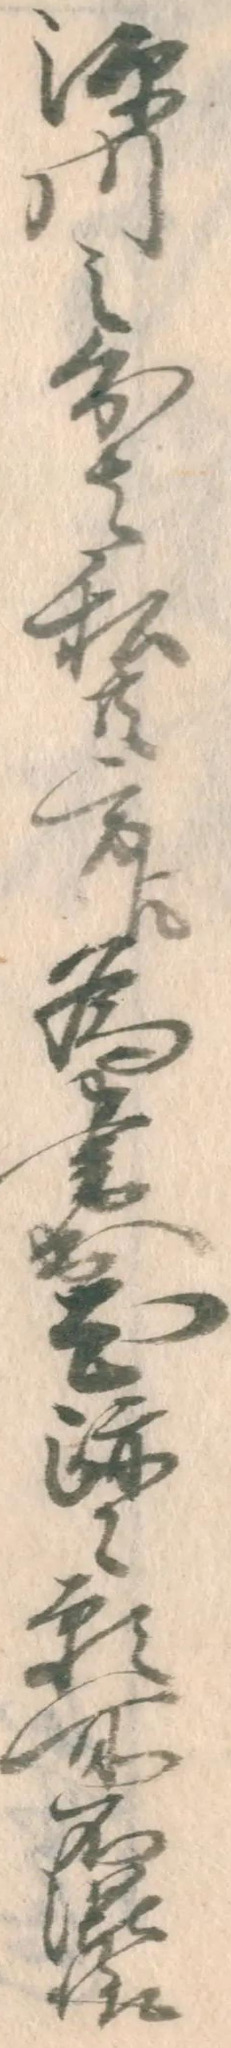深川之分は私共方え為書出尤跡々願所不混様
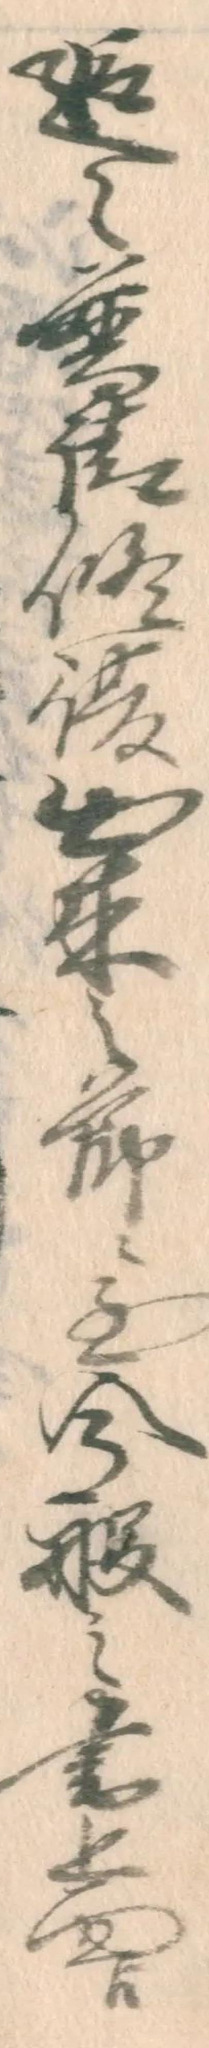追々普請修復出来之節ニ至今般之書上面え
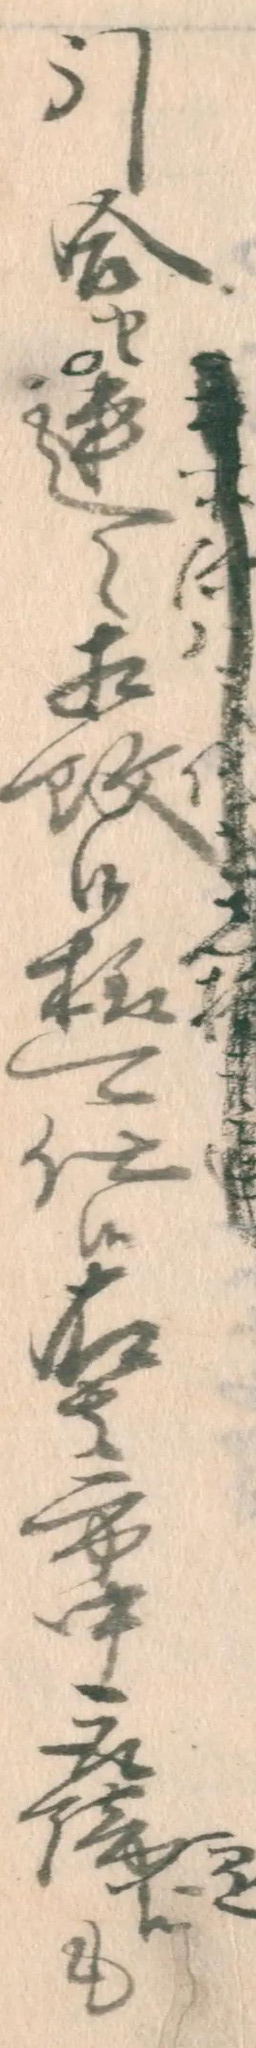引合申○連々相改候様可仕候右は市中取締懸えも
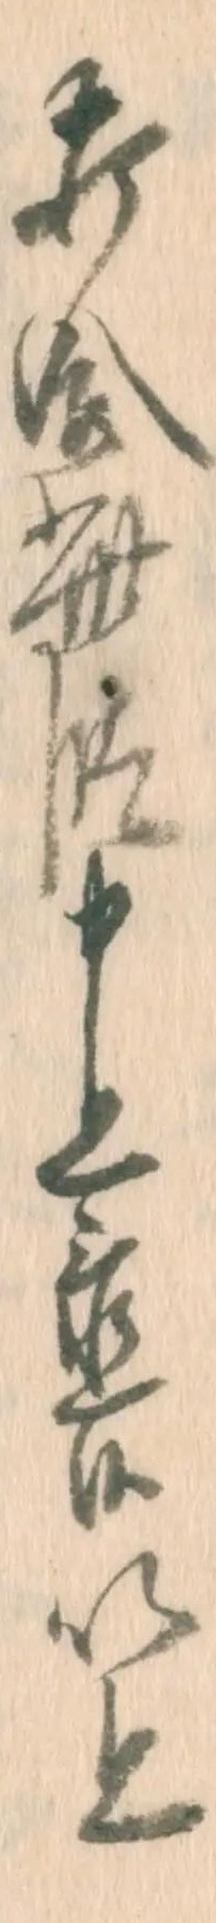打合此段申上置候以上
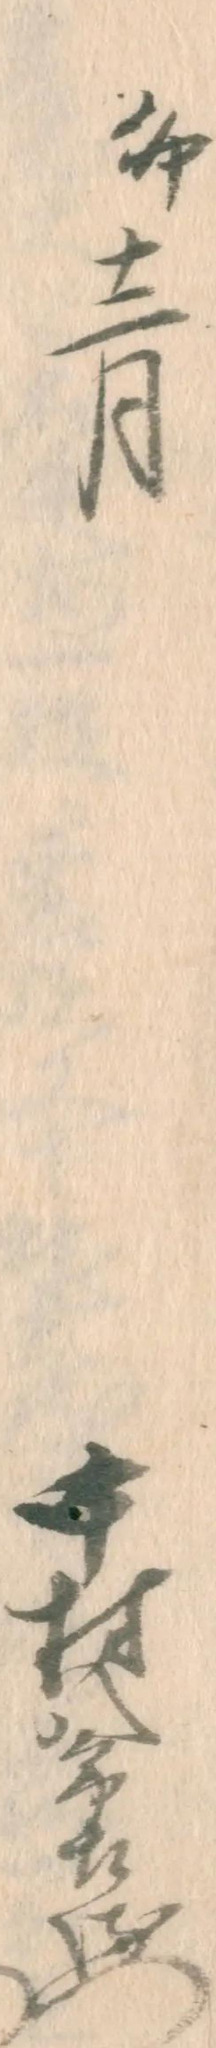卯十二月中村八郎左衛門
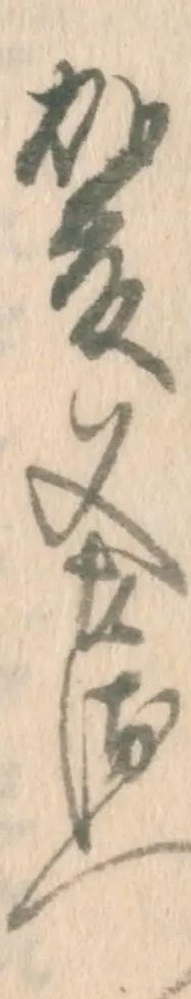加藤又左衛門

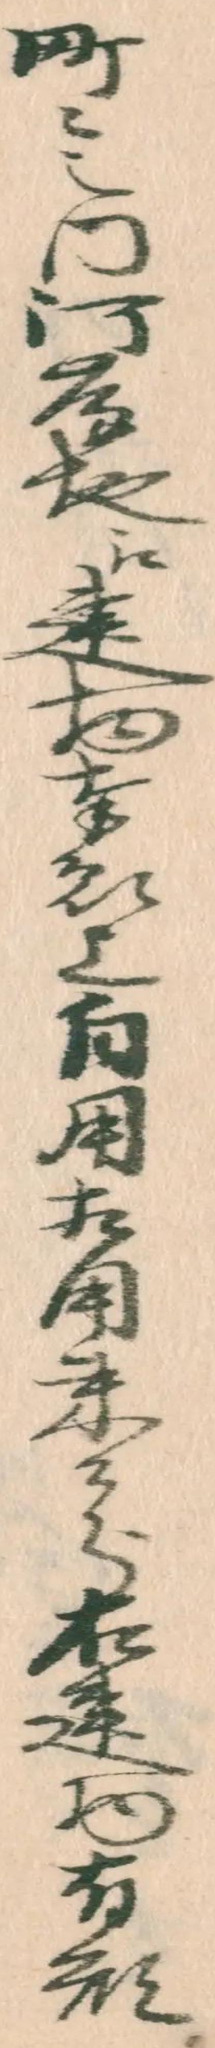町々之内河岸地え建物奉願上自用相用来候分右建物有形
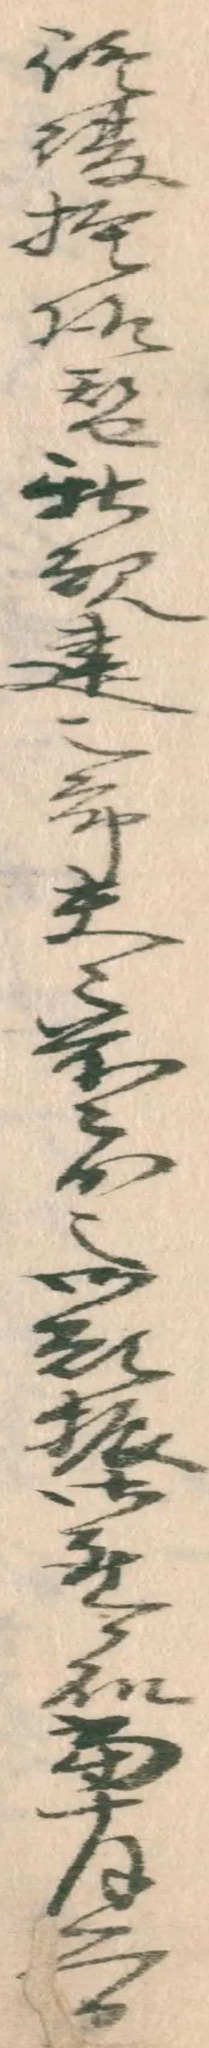修復模様替新規建之節夫々前々ゟ之御願振御座候処当月十月二日
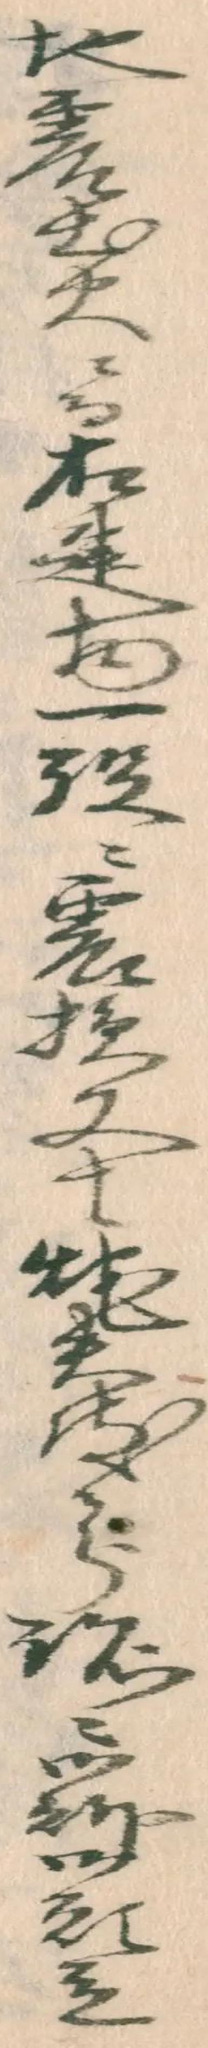地震出火ニ而右建物一ニ震損又は焼失致候分銘々御訴御願立
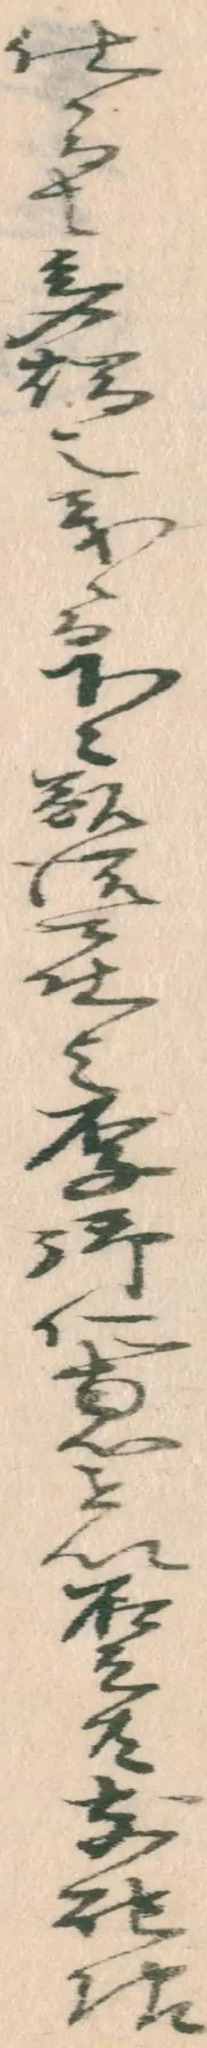仕候而は多端之義ニ而下々難渋可仕と厚御仁恵を以名主共支配限
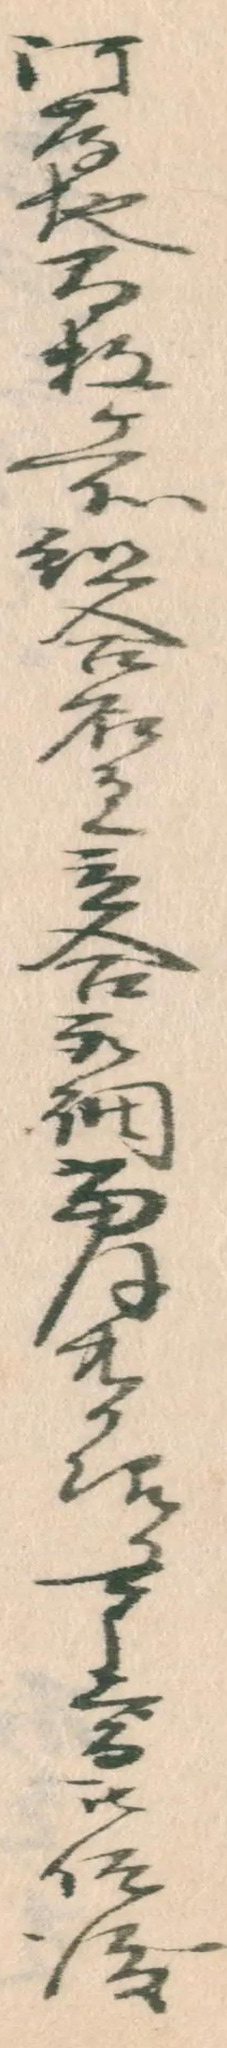河岸地間数ケ所組合名主立合取調当月廿日限り可申上旨被仰渡
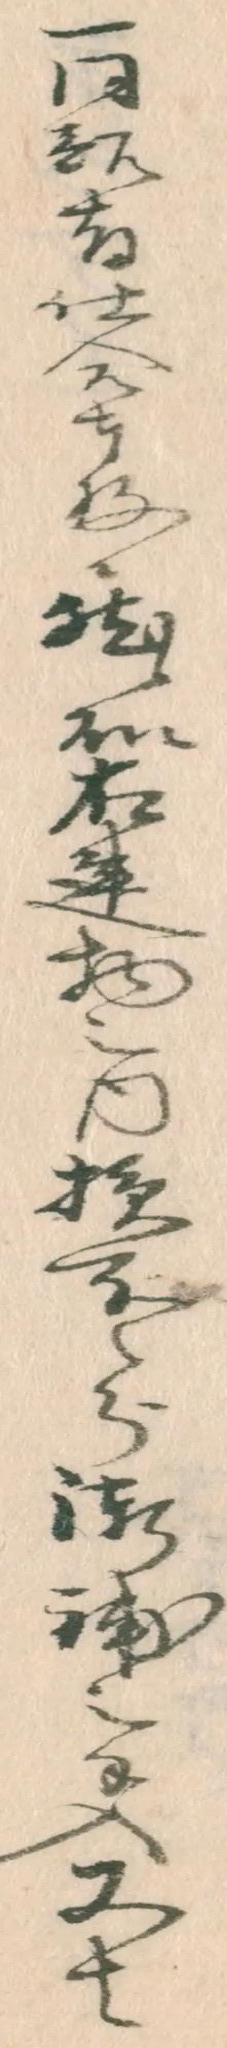一同難有仕合奉存候然ル処右建物之内損所之分漸補之手入又は
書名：地震災書留 2巻. [1] 内表紙に「地震災書留　安政二卯年　但本所深川御用屋敷地代免除調」とあり
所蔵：国立国会図書館 National Diet Library, JAPAN
